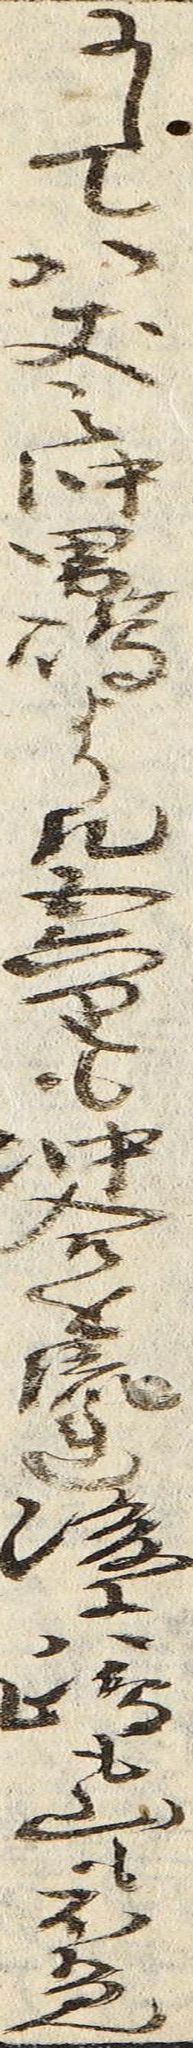にして八丈之沖男島より凡五六里も沖合を流れ後には島も山も不相見
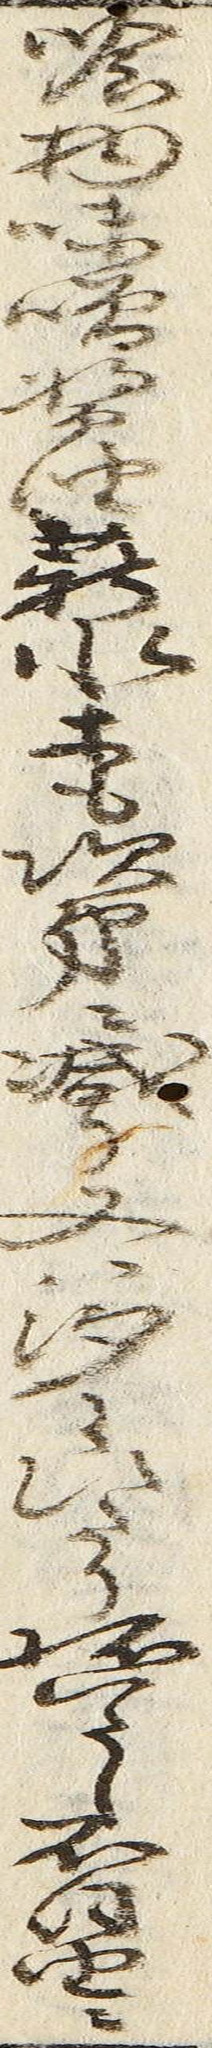喰物味噌醤油薪水等も次第に減り又は汐にひたり抔いたし不自由に
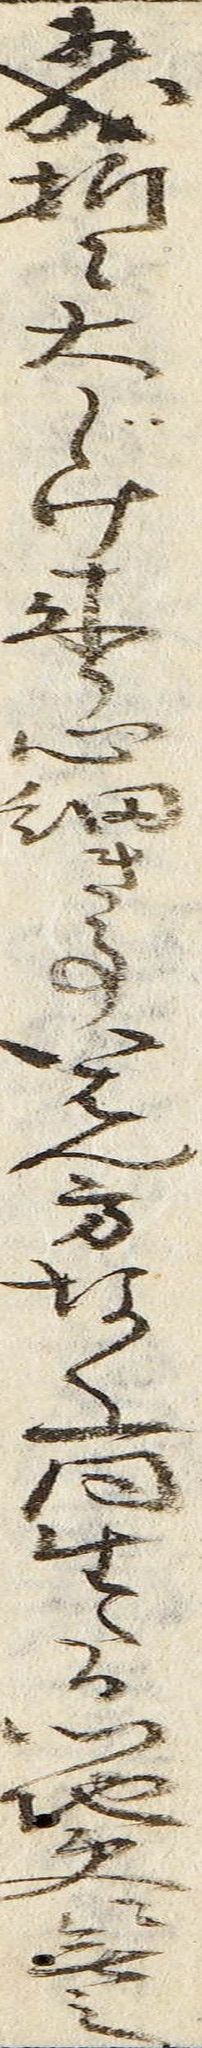相成折々大じけ来り心細き事いはん方なく一同生たる心地更に無之
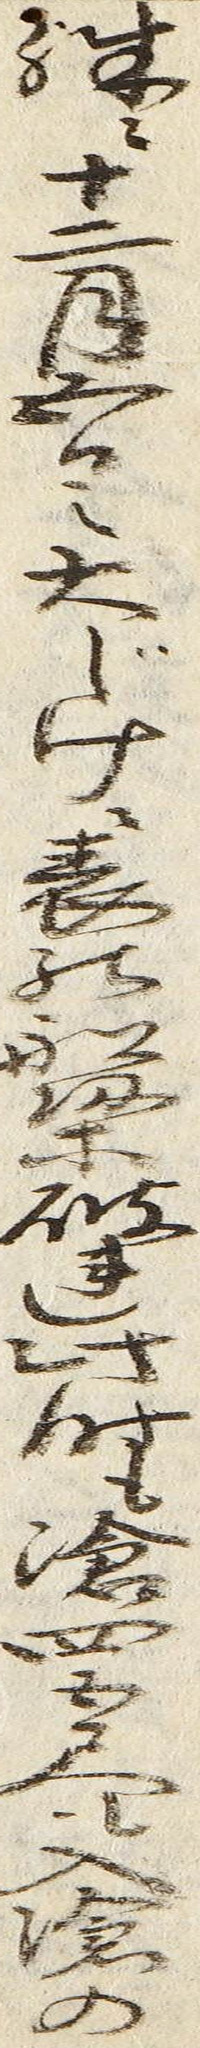殊に十二月五日之大じけに表の船梁破れ此時も滄四五尺も入滄の
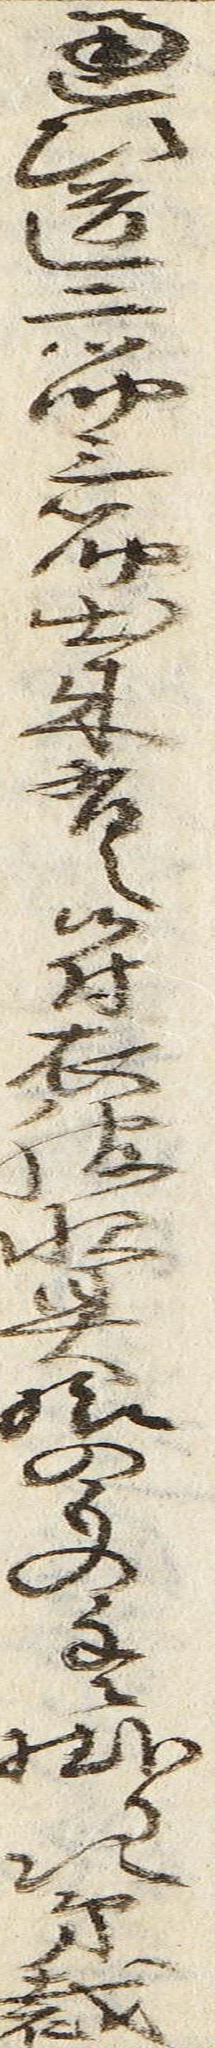通ひ道二筋三筋出来有之候付衣服夜具様のもの手に掛り次第裁
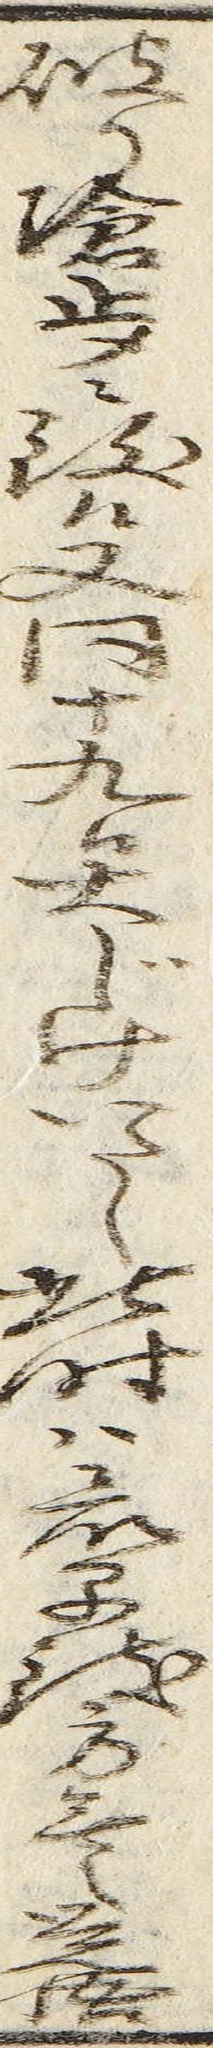破り滄止めに致候又同十九日大じけいたし此時は最早致方無之覚悟
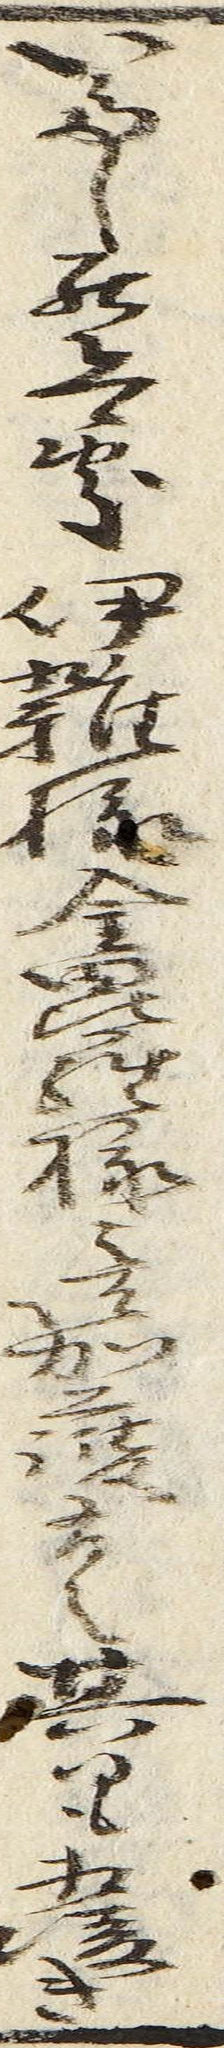いたし罷在候処伊雑様金毘羅様之御加護有之其日も相凌き
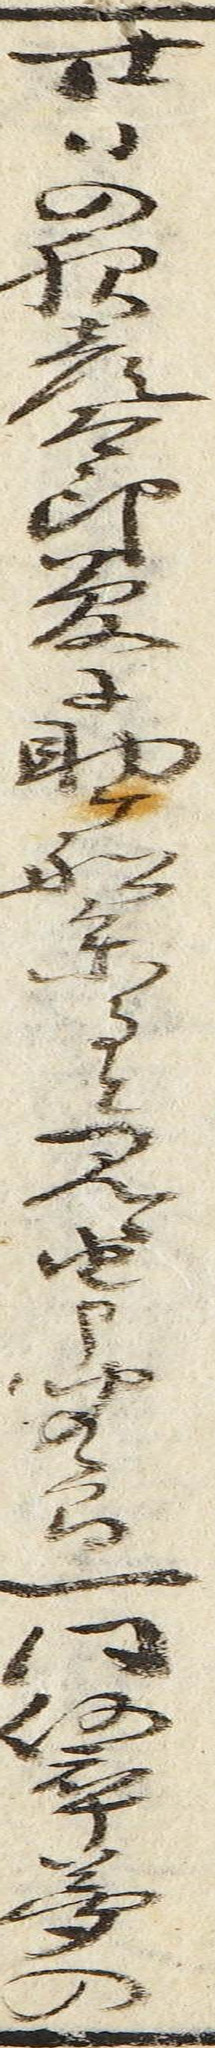廿日の夜彦太郎夢に助け船参ると見候由申聞候間一同何卒夢の
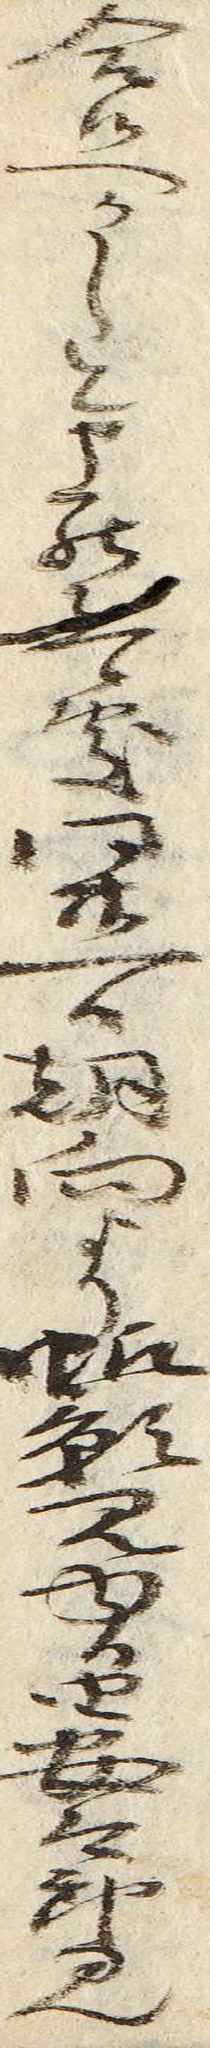合候へかしと申罷在候処同廿一日朝向より帆影見ゆる由安太郎見
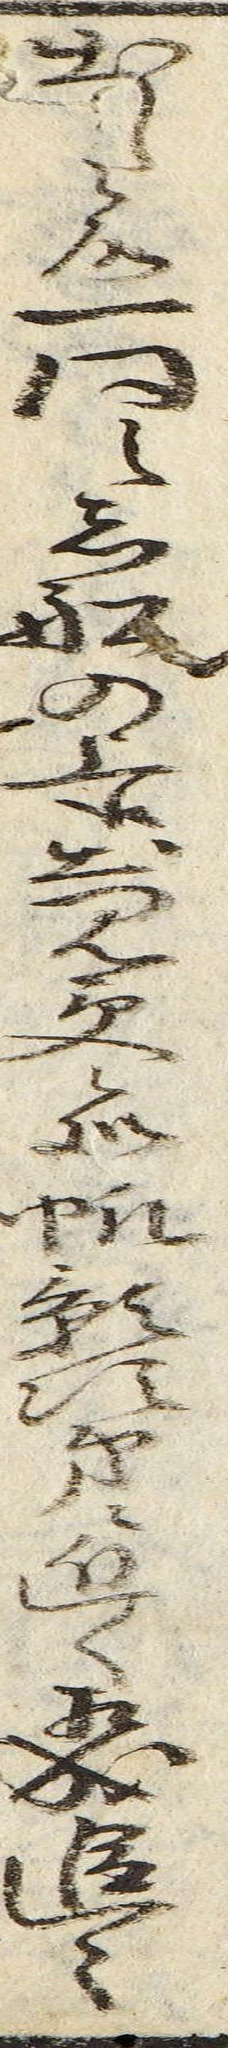出し候故一同之者船の上江出見受候処帆影次第に近く相成追々

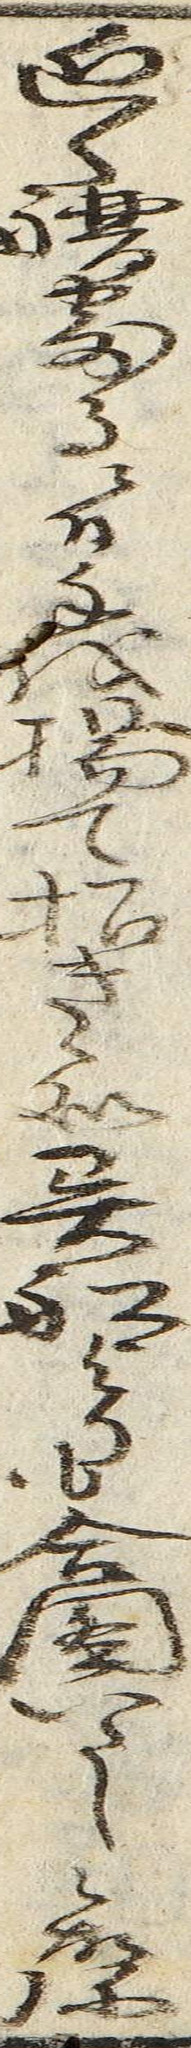近く艚寄るに付手を揚て招き候処異船よりも合図いたし候故弥
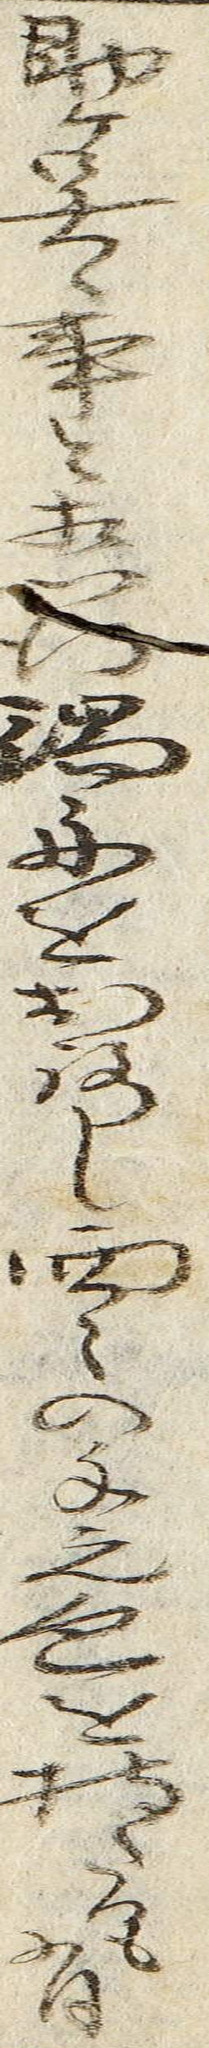助け呉候事と相心得端舟をおろし面々の手之包を持たるも有
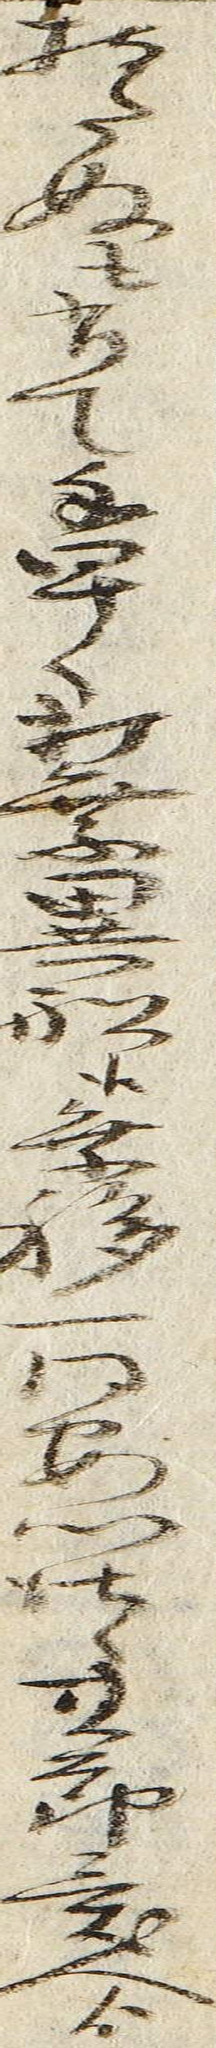持たぬも有て手早く打乗異船江乗移一同安心仕候其節異人ゟ
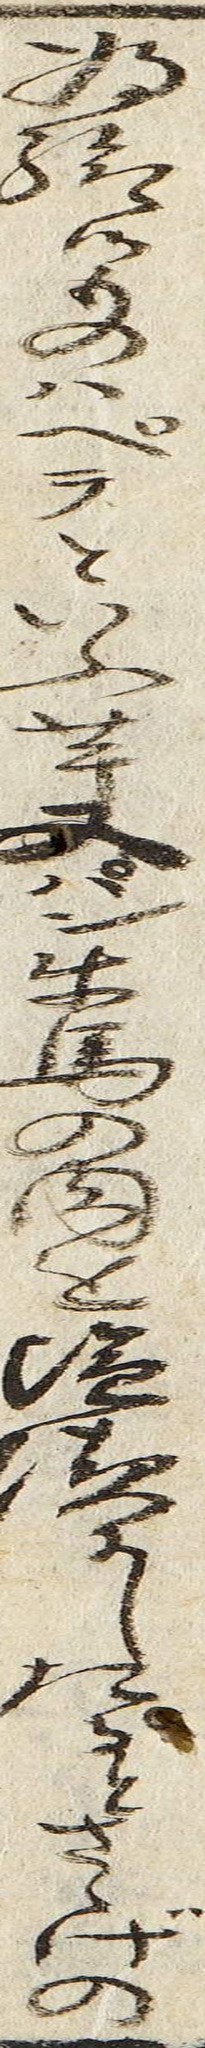為給候ものハペラといふ芋又パン牛馬の肉を塩漬にしたるとさゝげの
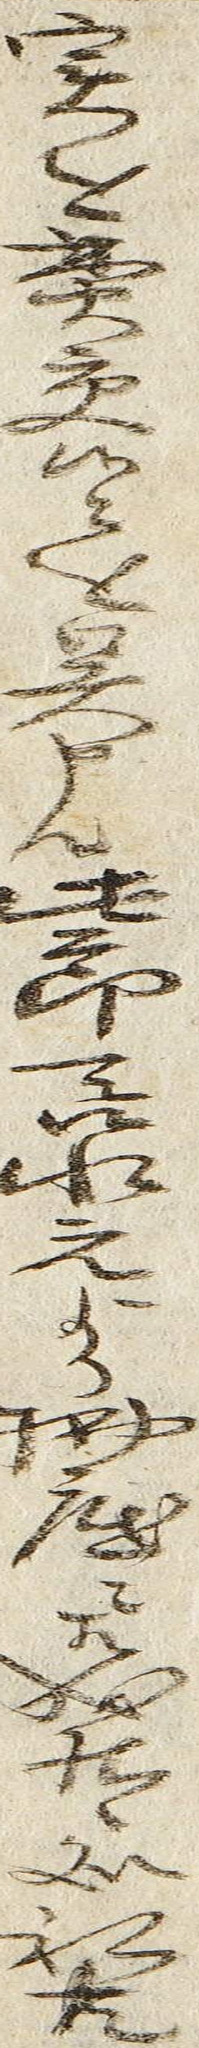実を煮交候とを呉申候此節呑水元より払底に相成居候処私共
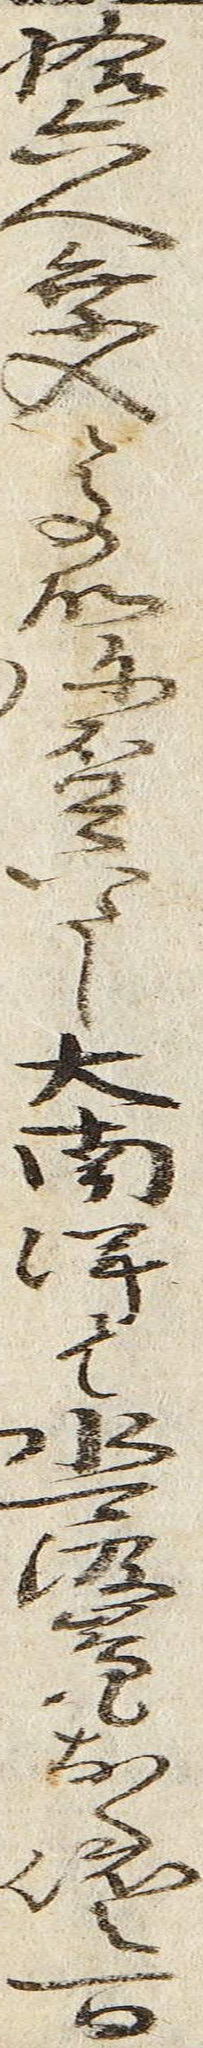拾六人乗入候事故弥不足いたし大南洋にて水可汲島もなく依之一日
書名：漂流夢物語
